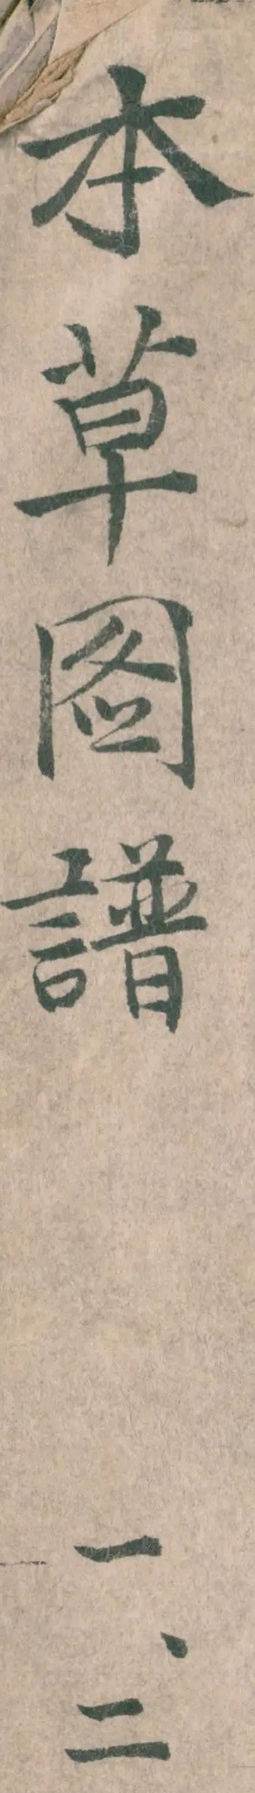本草図譜一、二

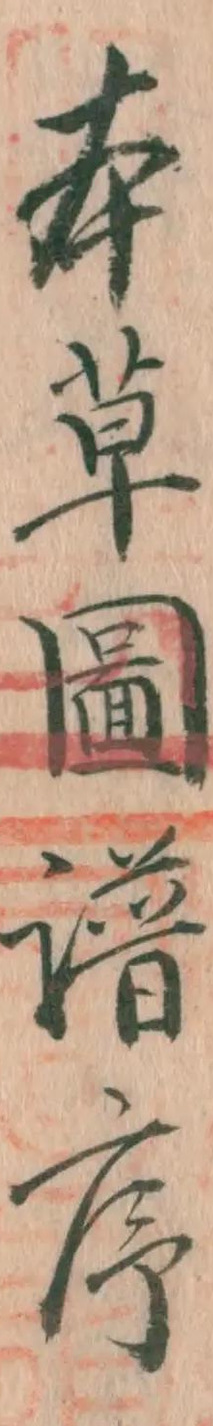本草図譜序
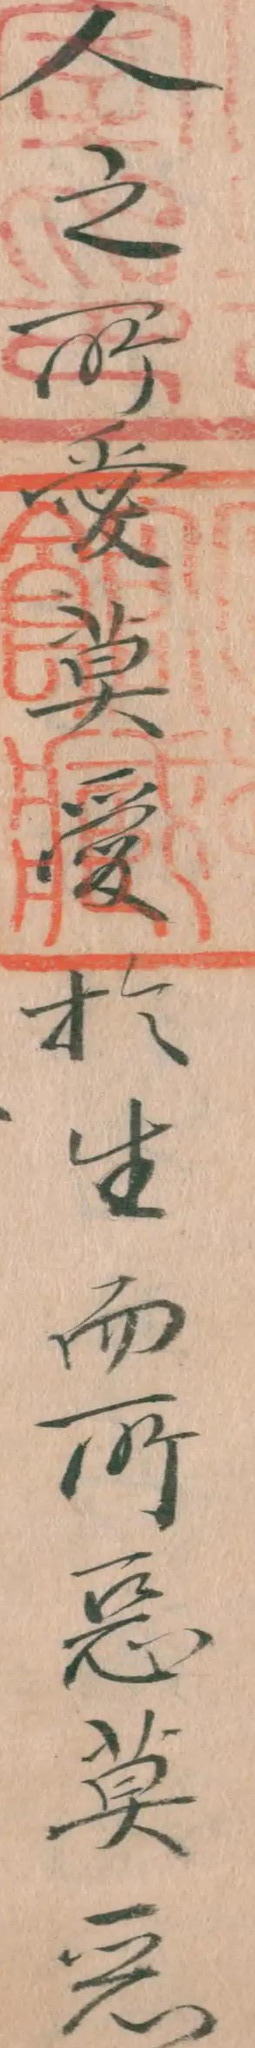人之所愛莫愛於生而所悪莫悪
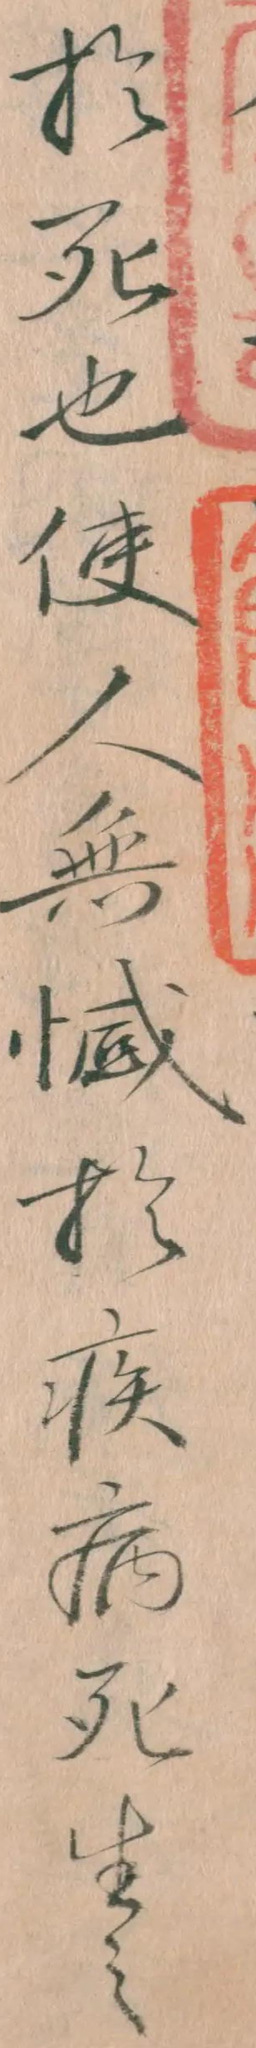於死也使人無憾於疾病死生之
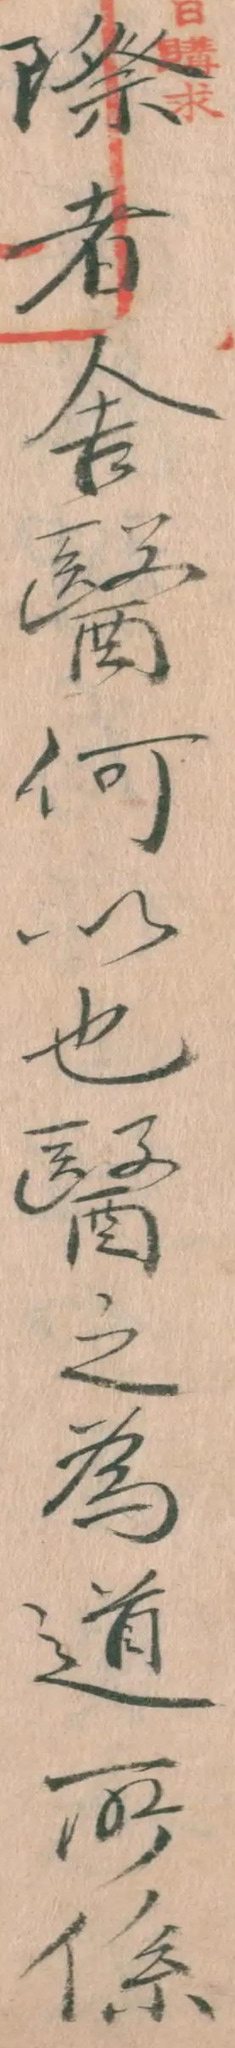際者舎医何以也医之為道所係
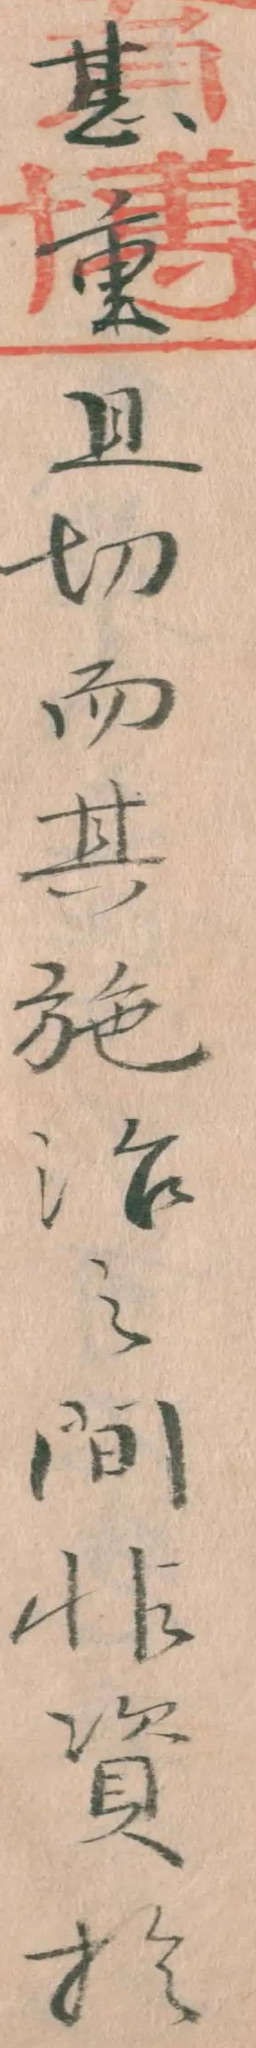甚重且切而其施治之間非資於
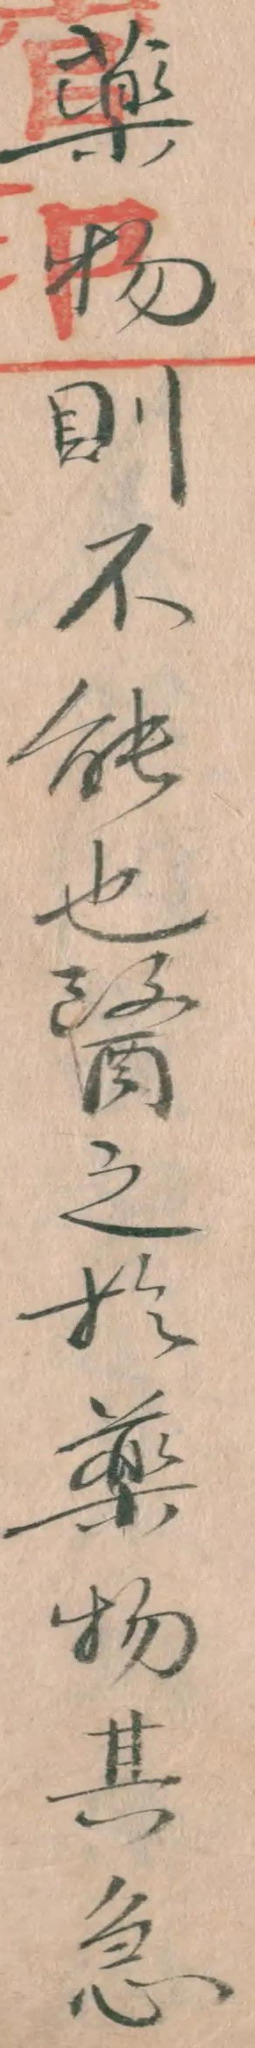薬物則不能也医之於薬物其急
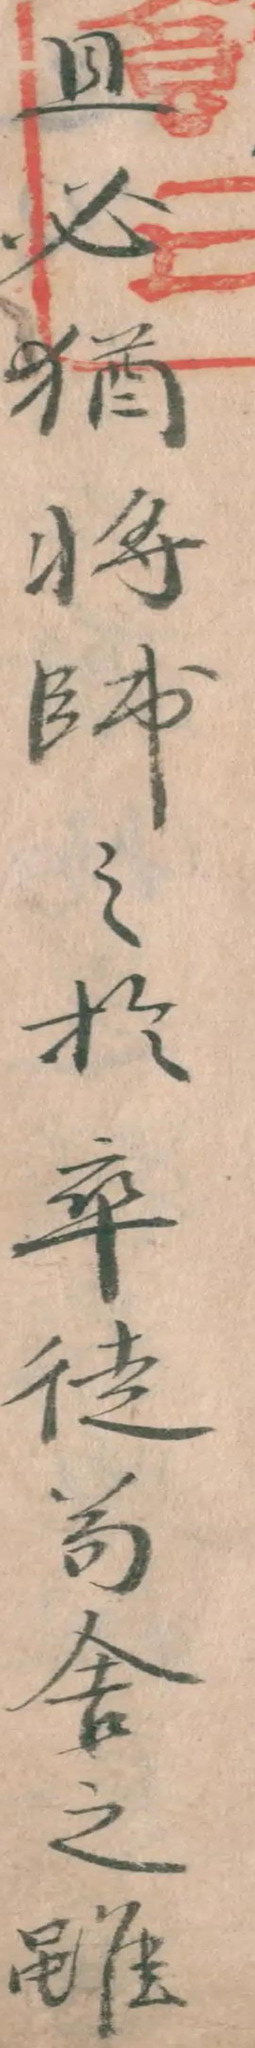且必猶将師之於卒徒苟舎之雖
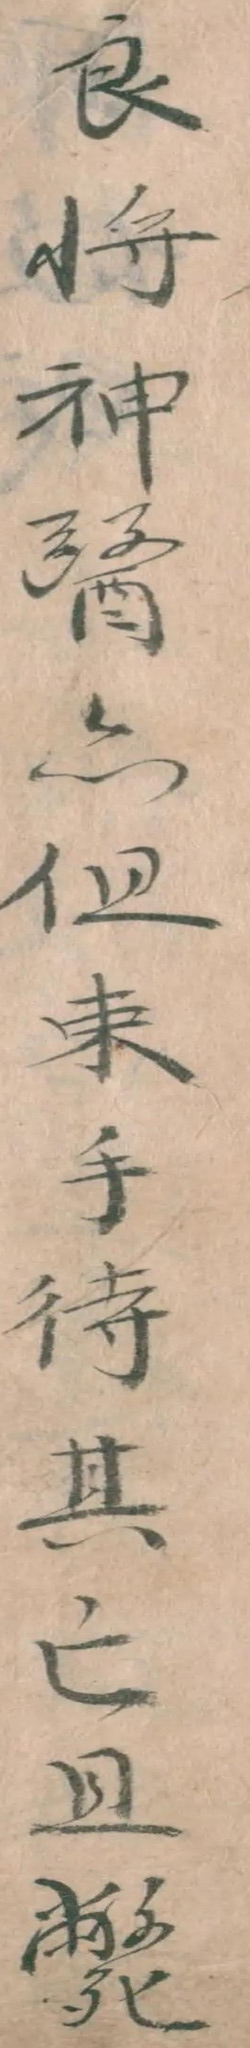良将神医亦但束手待其亡且斃

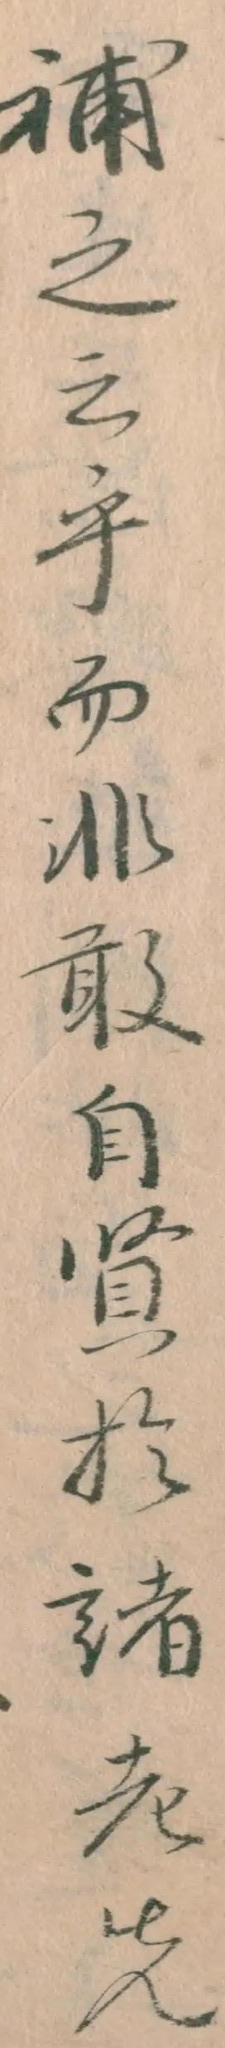補之云乎而非敢自賢於諸老先
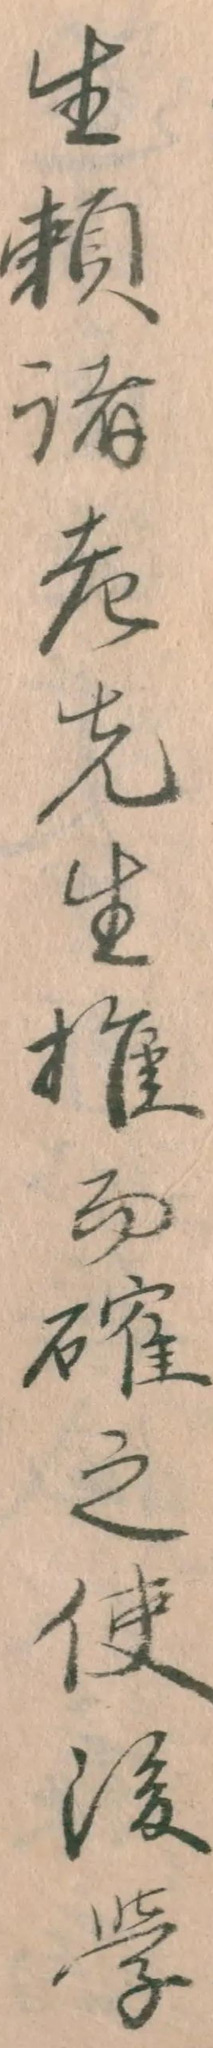生頼諸老先生推而確之使後學
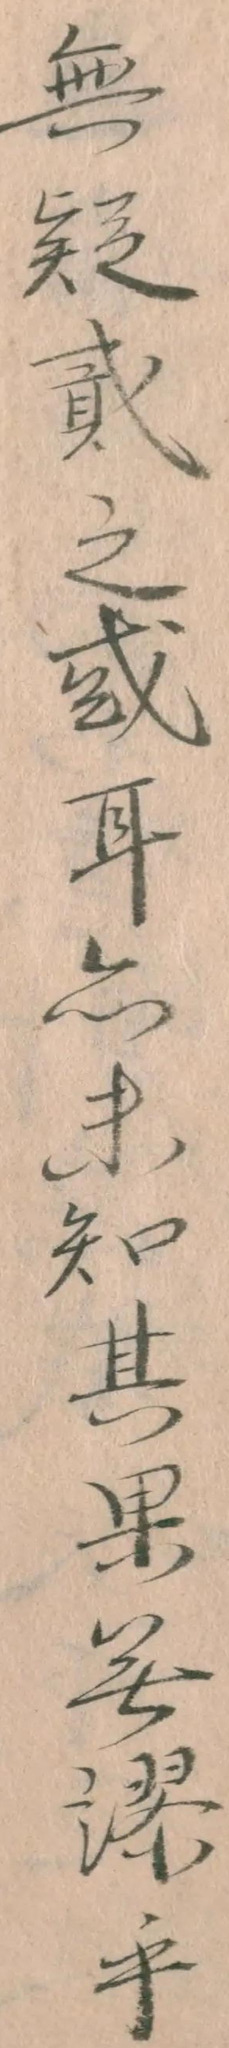無疑貮之感耳亦未知其果無謬乎
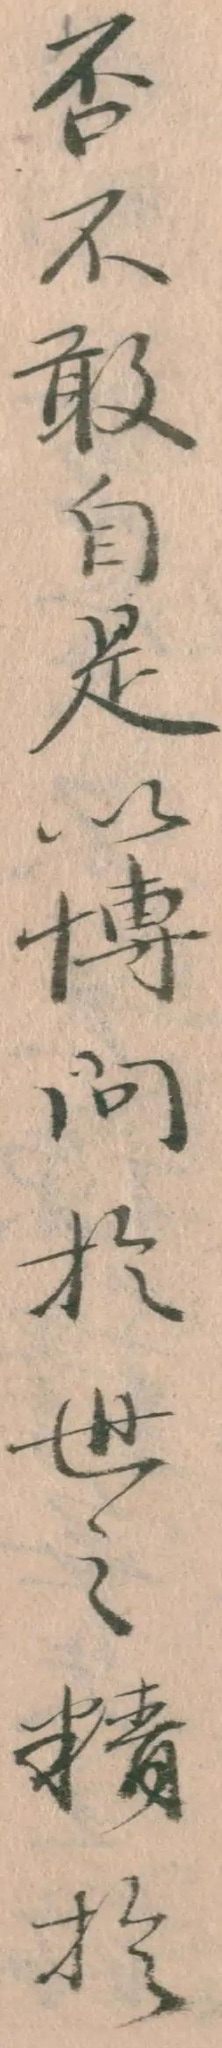否不敢自是以博問於世之精於
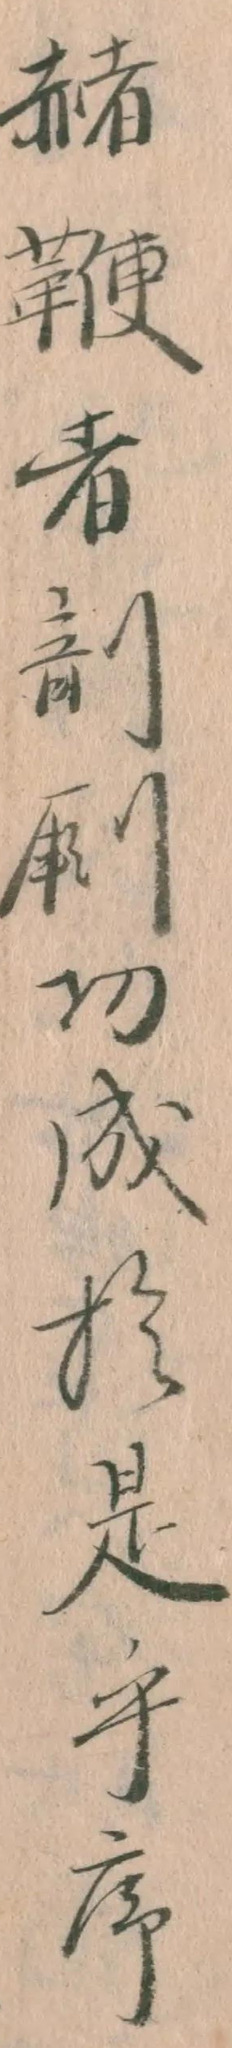赭鞭者𫦊励功成於是乎序
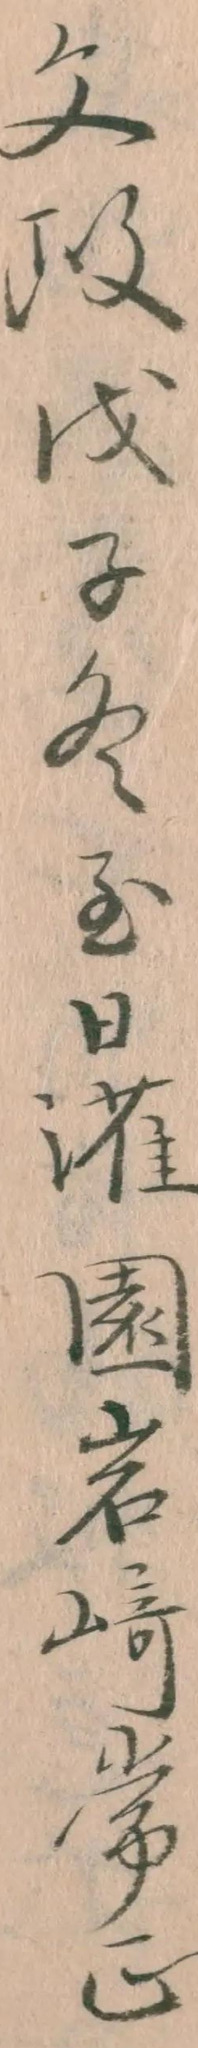文政戊子冬至日潅園岩崎常正
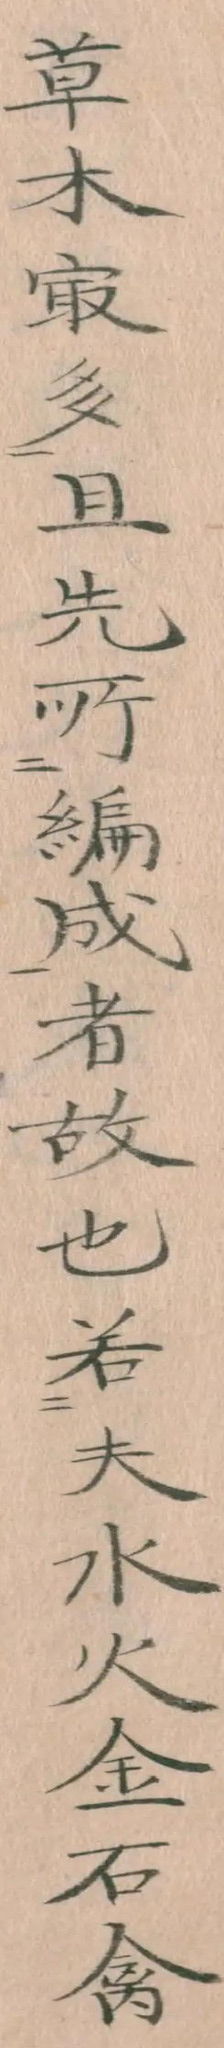草木最多且先所編成者故也若夫水火金石禽
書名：本草図譜. 巻5-6
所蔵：国立国会図書館 National Diet Library, JAPAN
